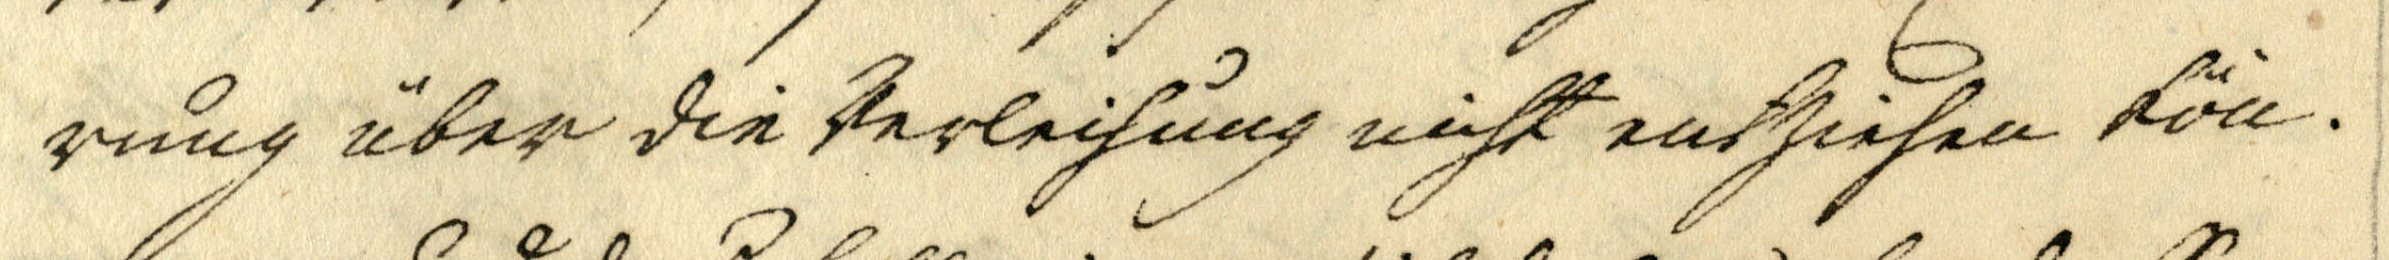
rung über die Verleihung nicht entziehen kön-
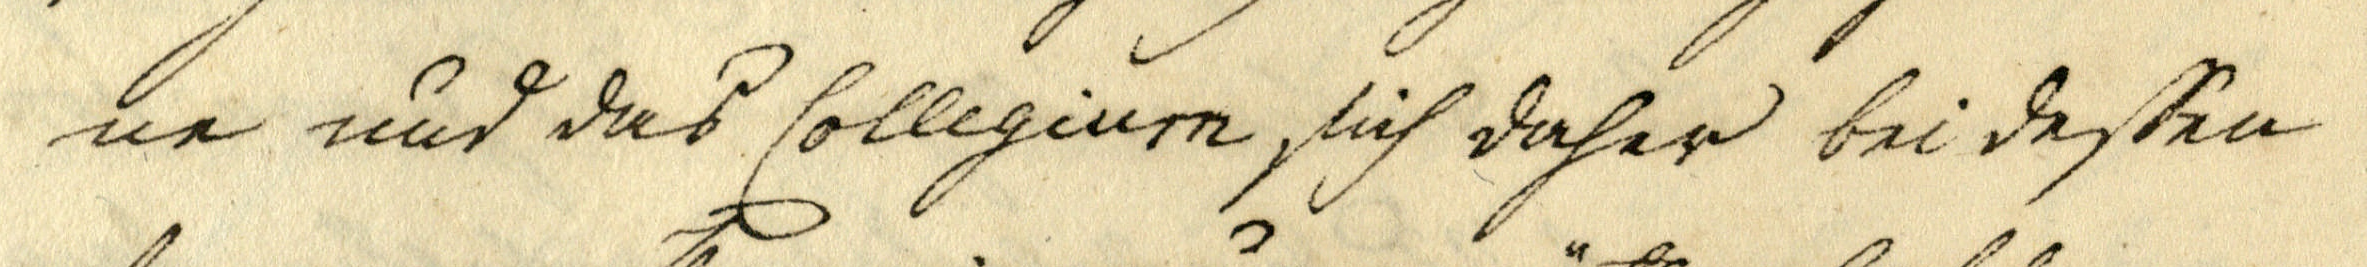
ne und das Collegium sich daher bei dessen
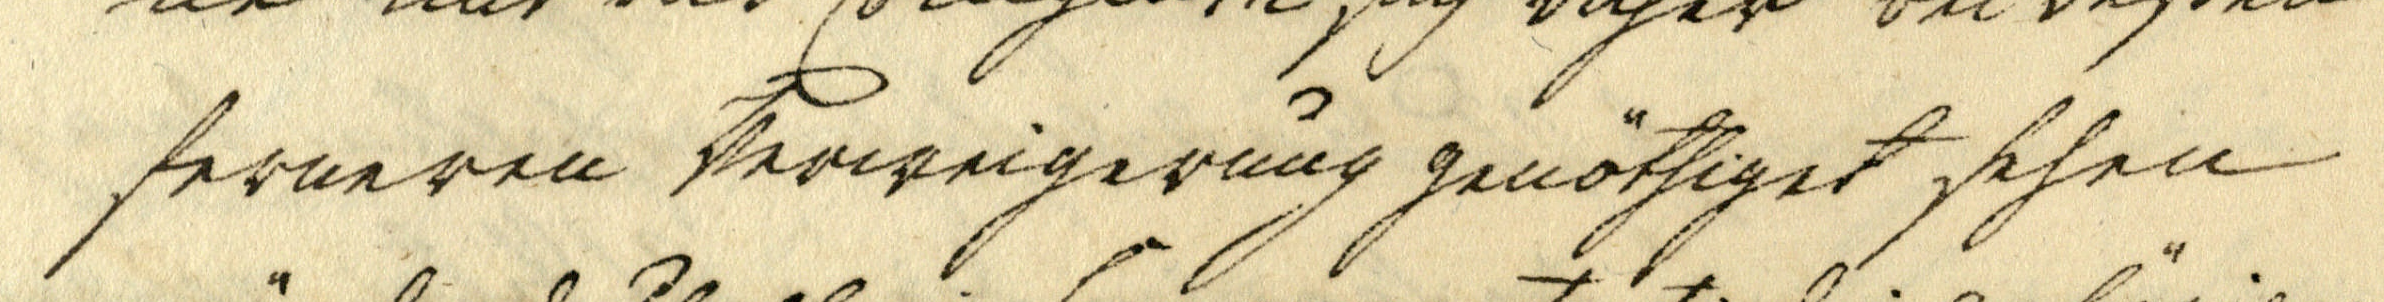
ferneren Verweigerung genöthiget sehen
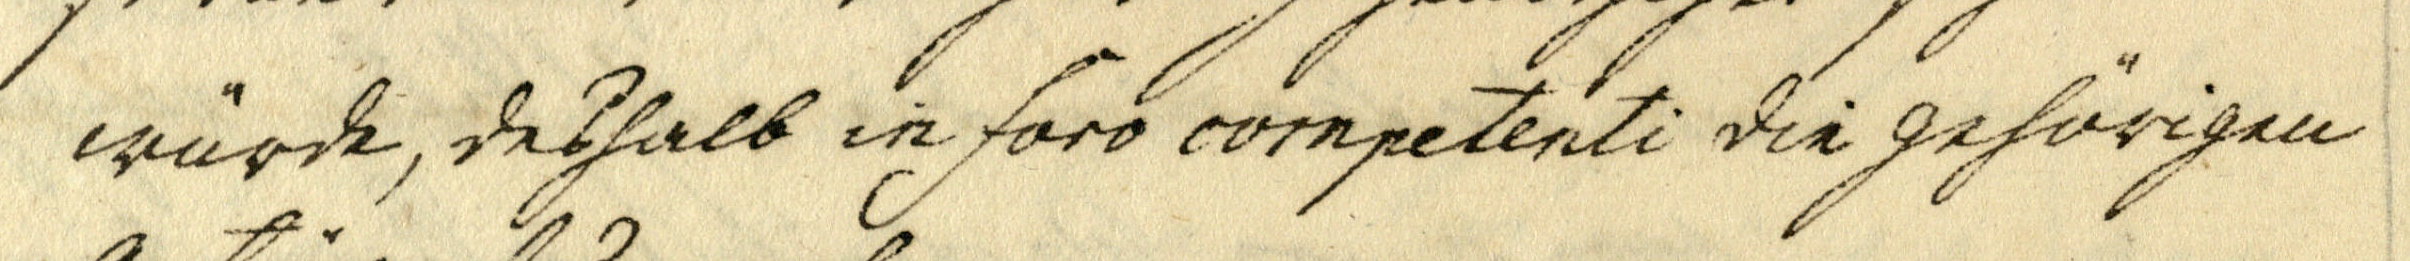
würde, deshalb in foro competenti die gehörigen
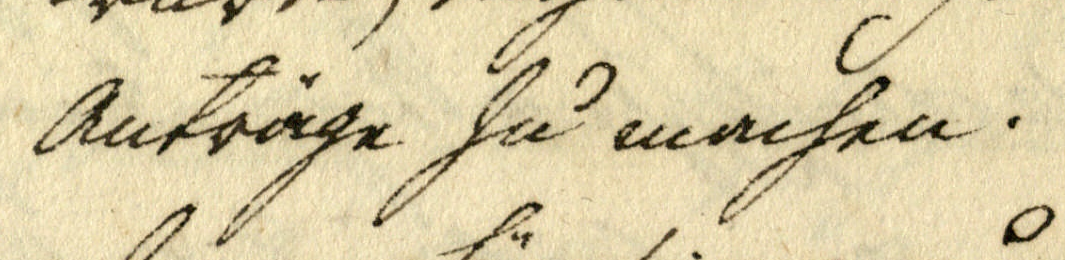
Anträge zu machen.
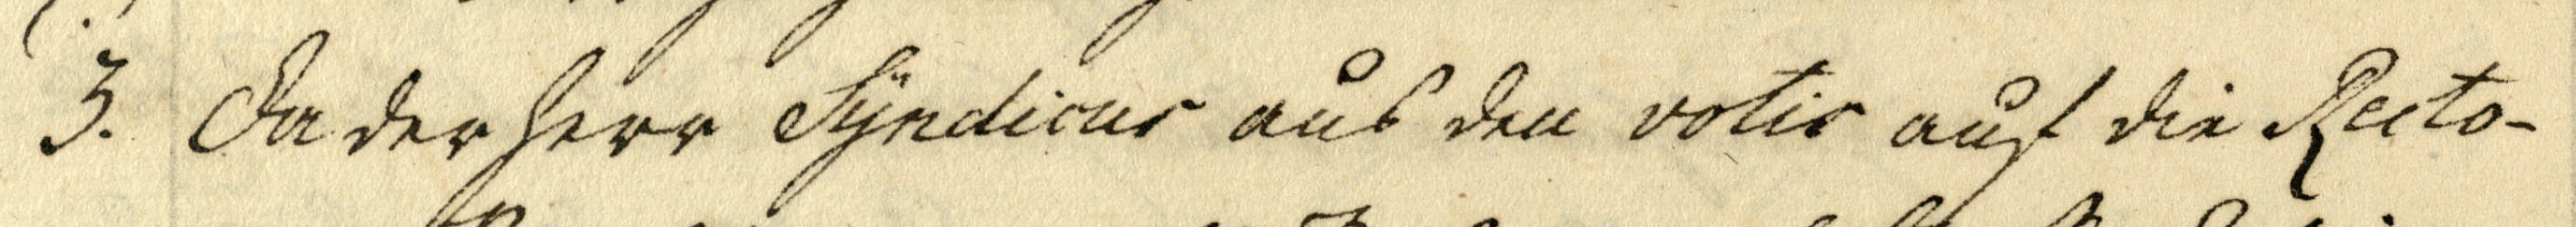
3. Da der Herr Sÿndicus aus den votis auf die Recto¬
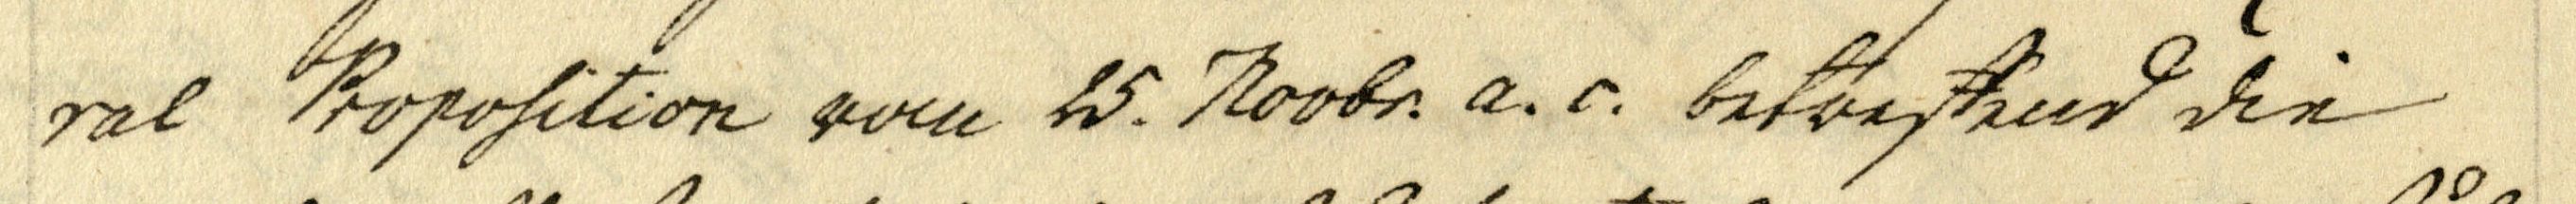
ral Proposition vom 25. Novbr. a. c. betreffend die
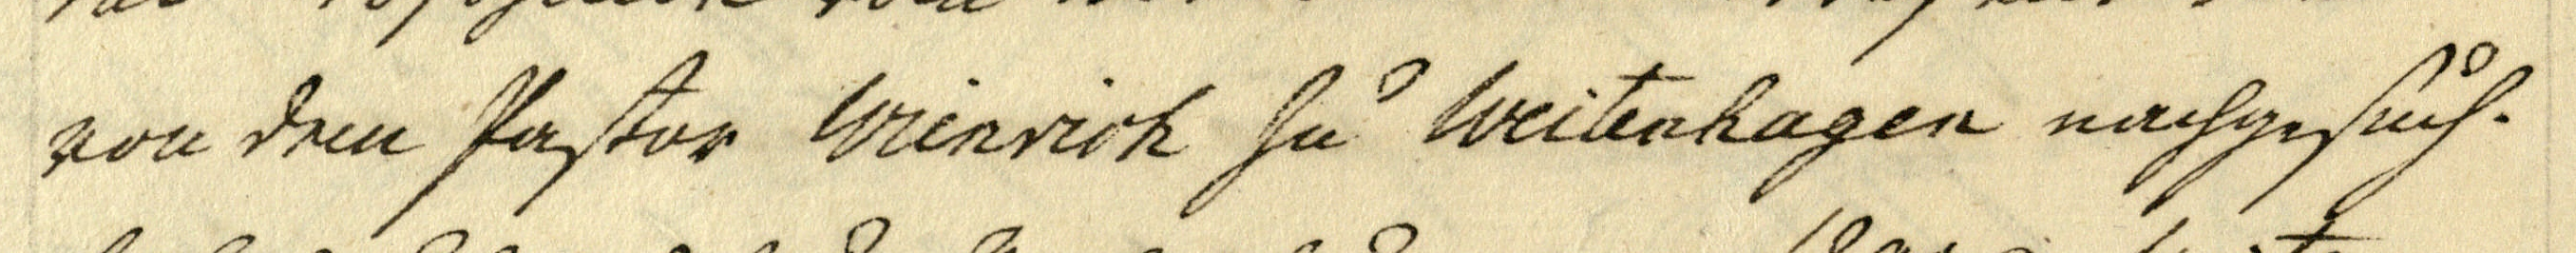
von dem Pastor Wienrich zu Weitenhagen nachgesuch¬
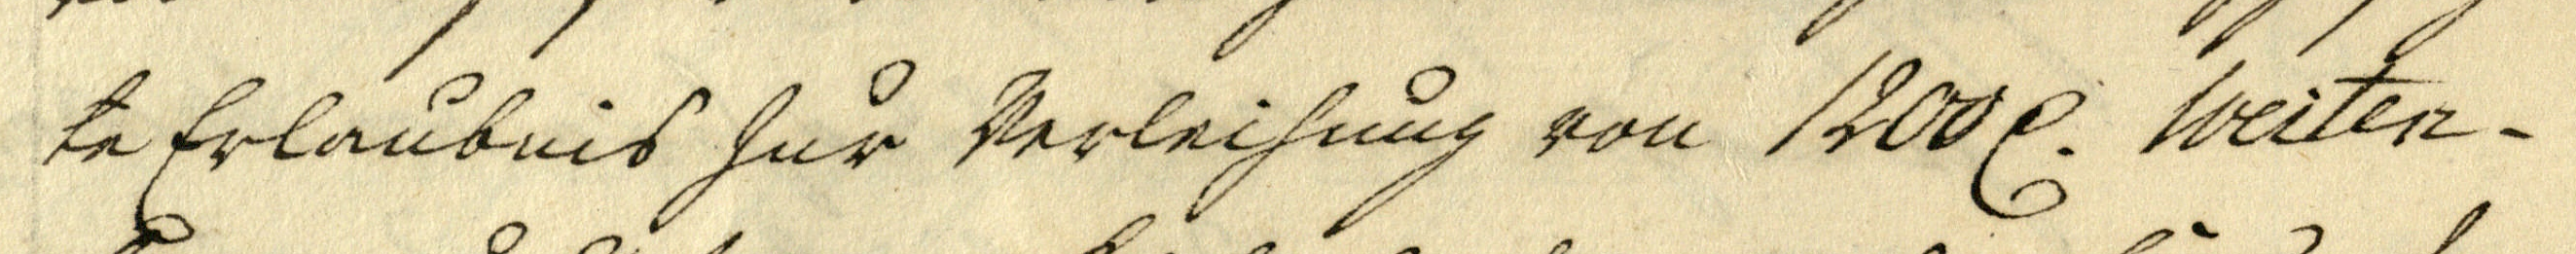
te Erlaubnis zur Verleihung von 1200 l. Weiten¬
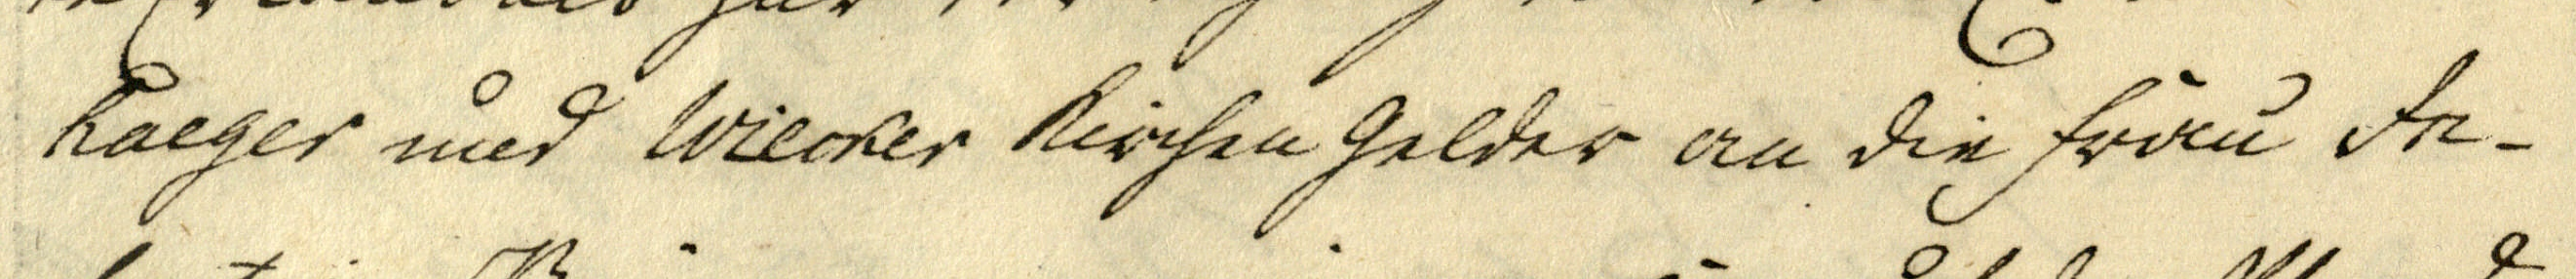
haeger und Wiecker Kirchen Gelder an die Frau In¬
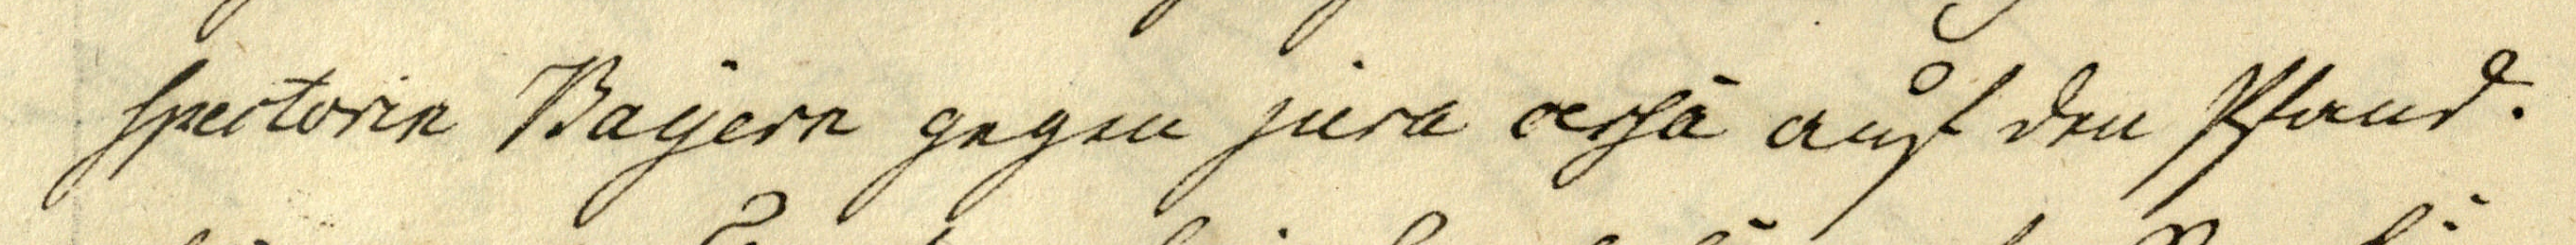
spectorin Baÿerm gegen jura cessa auf den Pfand¬
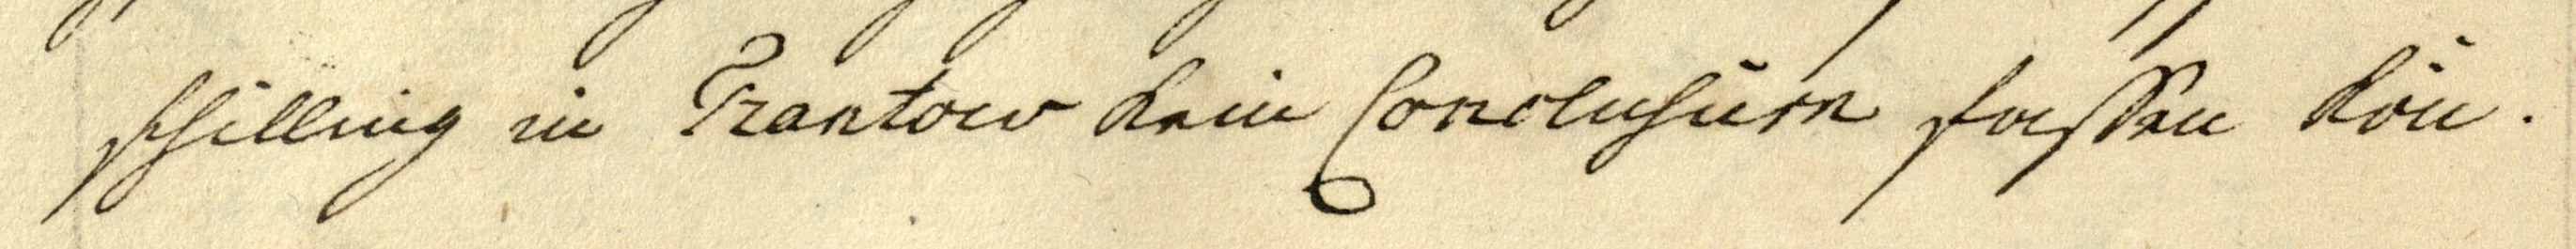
schilling in Trantow kein Conclusum fassen kön¬
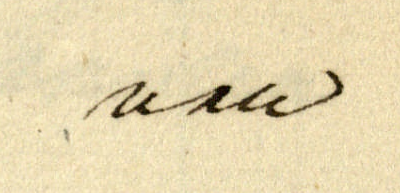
nen
